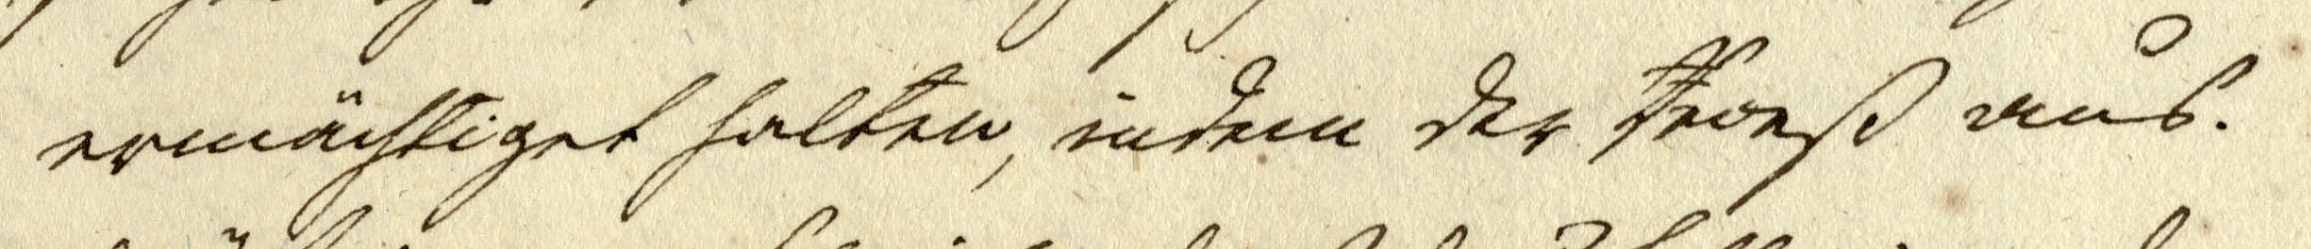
ermächtiget halten, indem der Receß aus¬
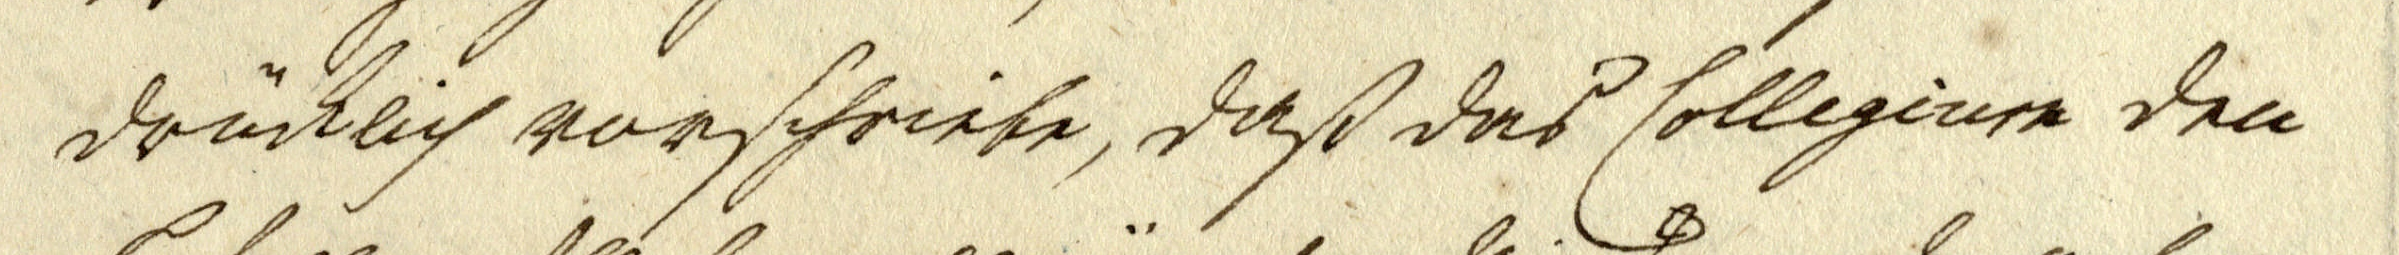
drücklich vorschriebe, daß das Collegium den
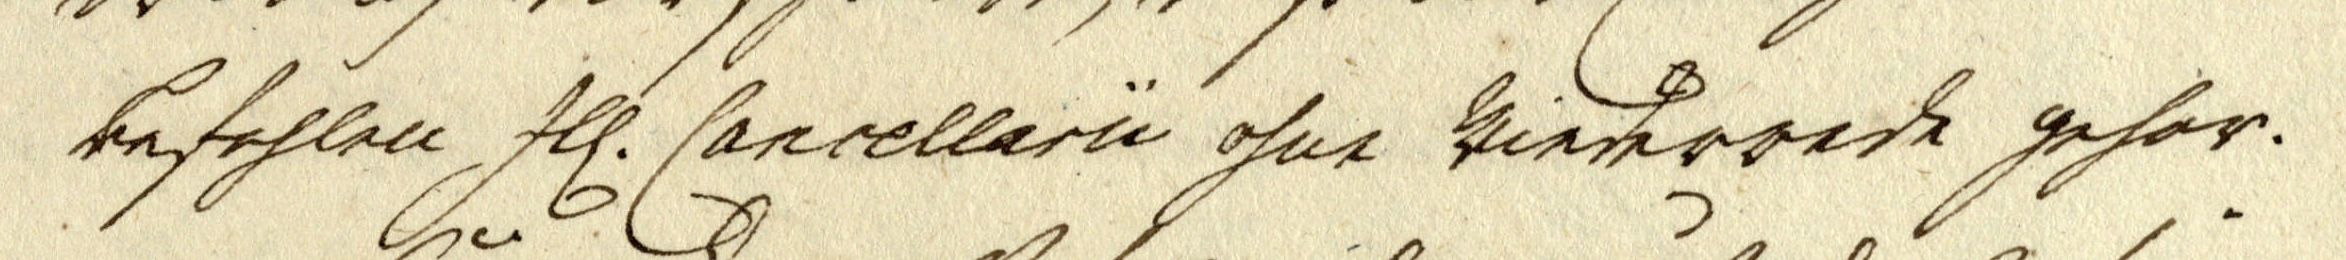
Befehlen Ill. Cancellarii ohne Wiederrede gehor¬
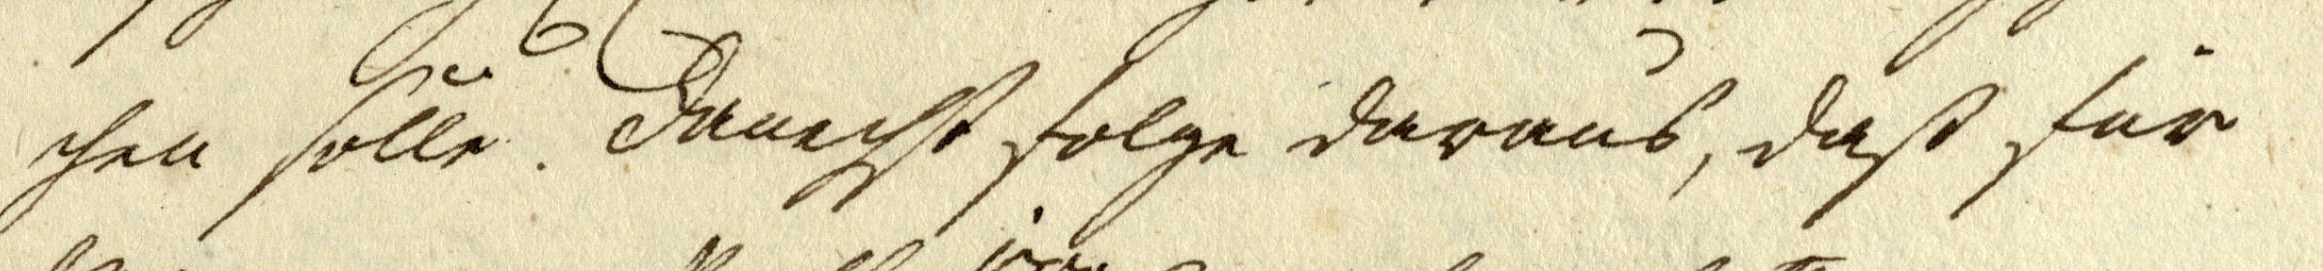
chen solle. Danechst folge daraus, daß für
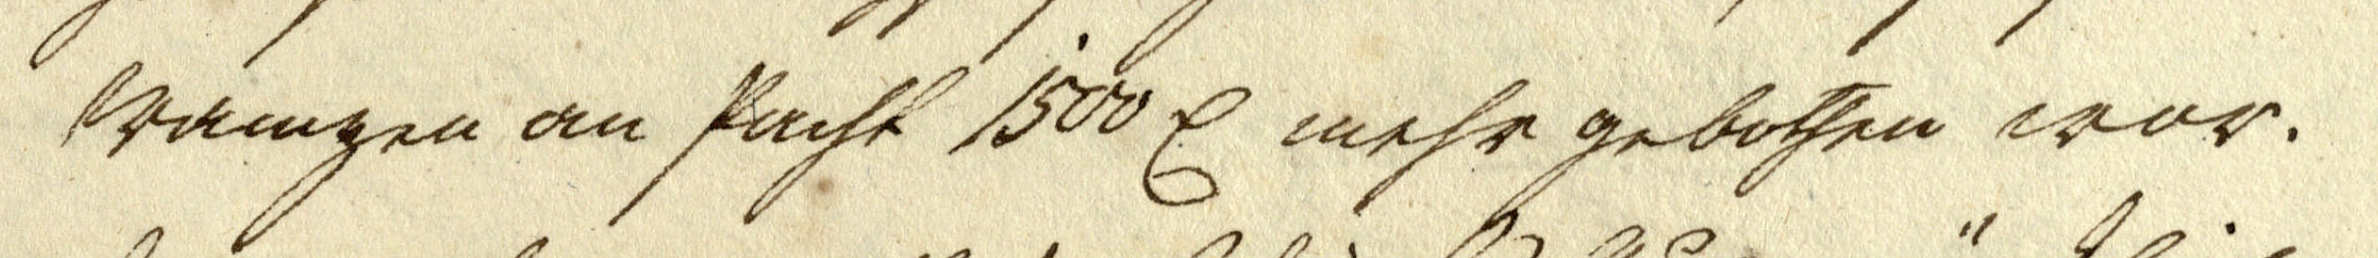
Wampen an Pacht 1500 l mehr gebothen wor¬
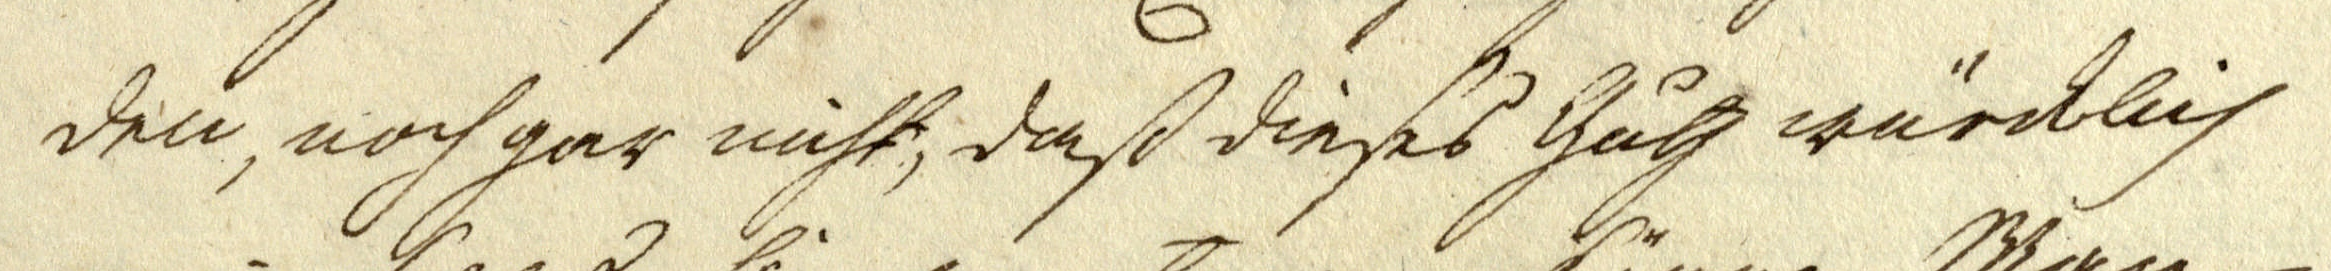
den, noch gar nicht, daß dieses Guth würcklich
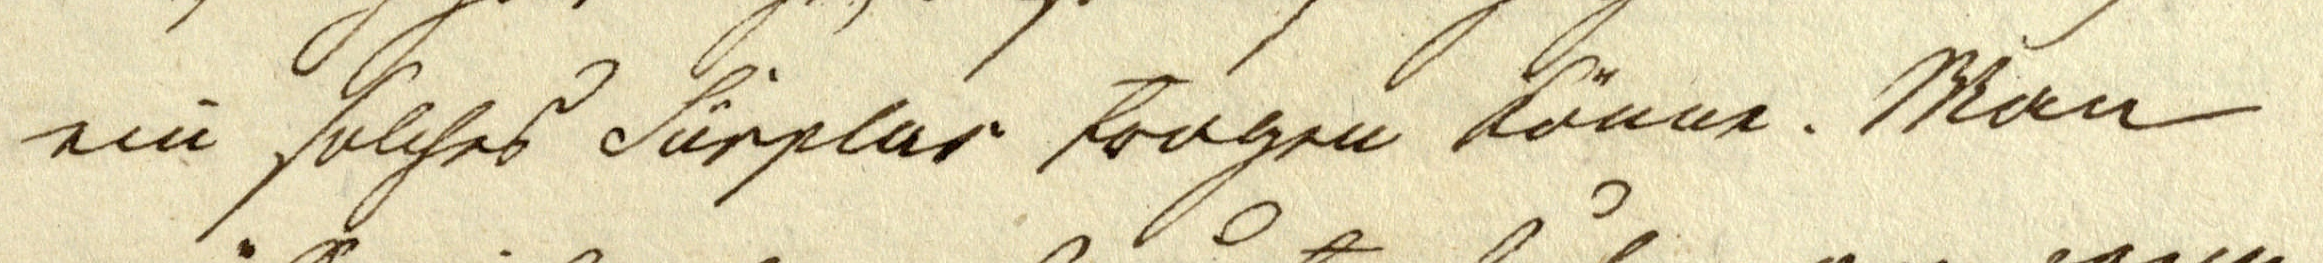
ein solches Sürplus tragen könne. Man
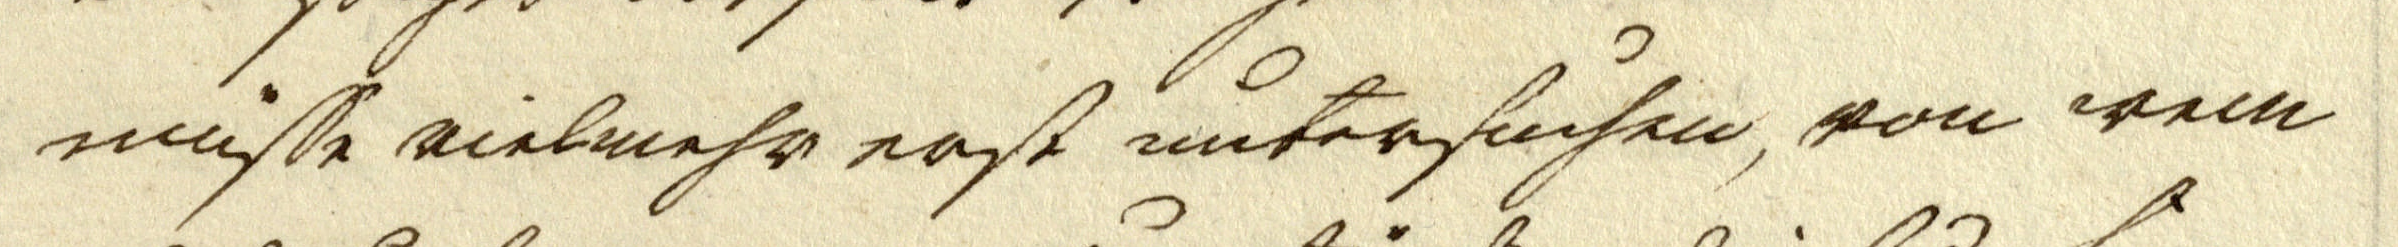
müsse vielmehr erst untersuchen, von wem
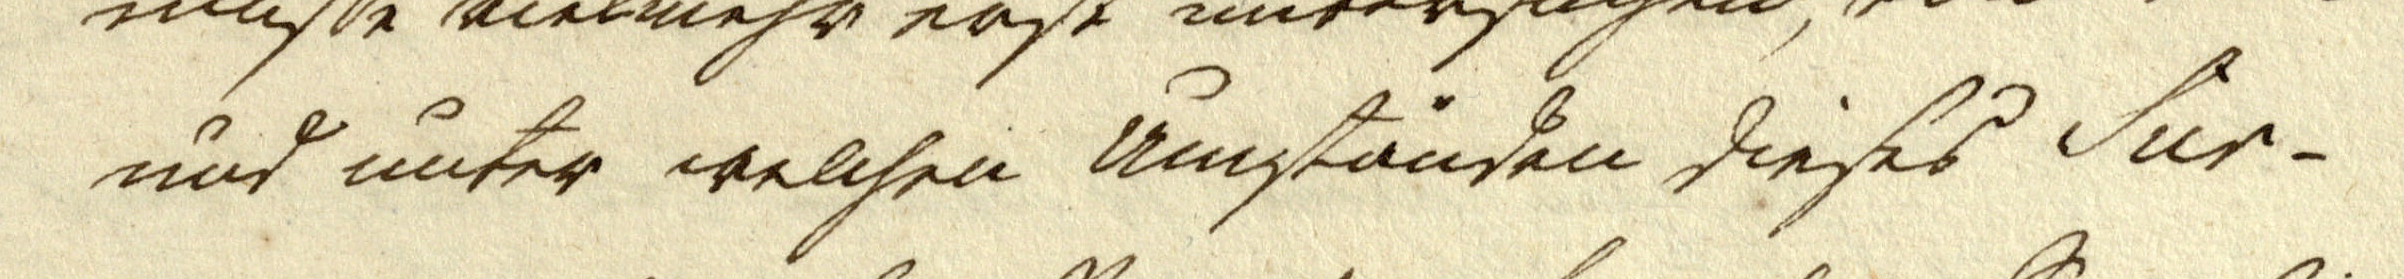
und unter welchen Umständen dieses Sür¬
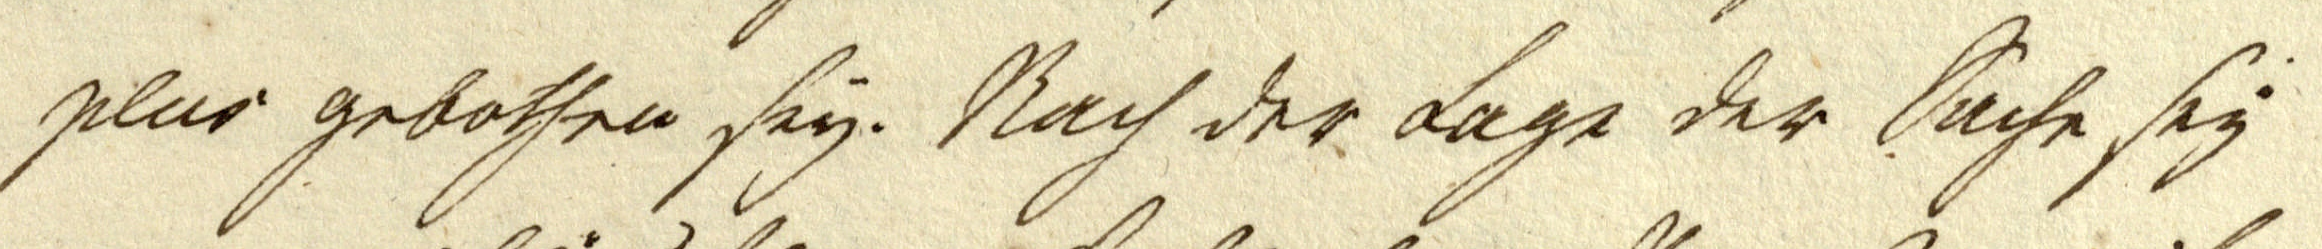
plus gebothen seÿ. Nach der Lage der Sache seÿ
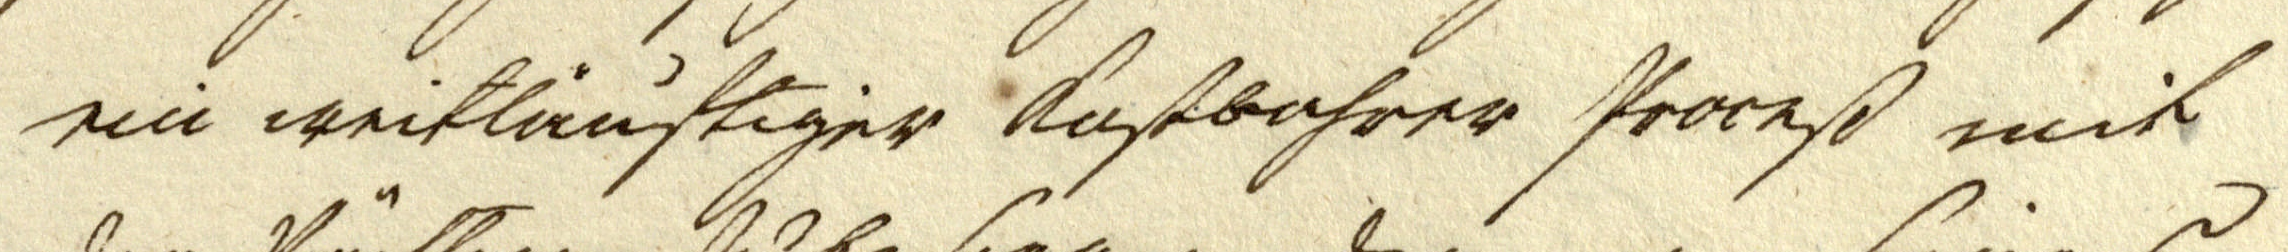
ein weitläuftiger kostbahrer Proceß mit
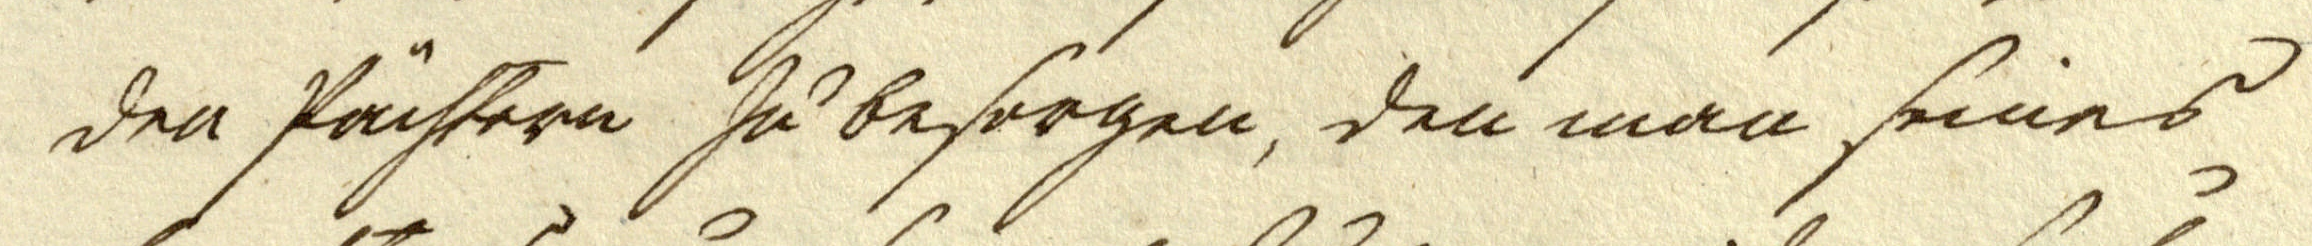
den Pächtern zu besorgen, den man seines
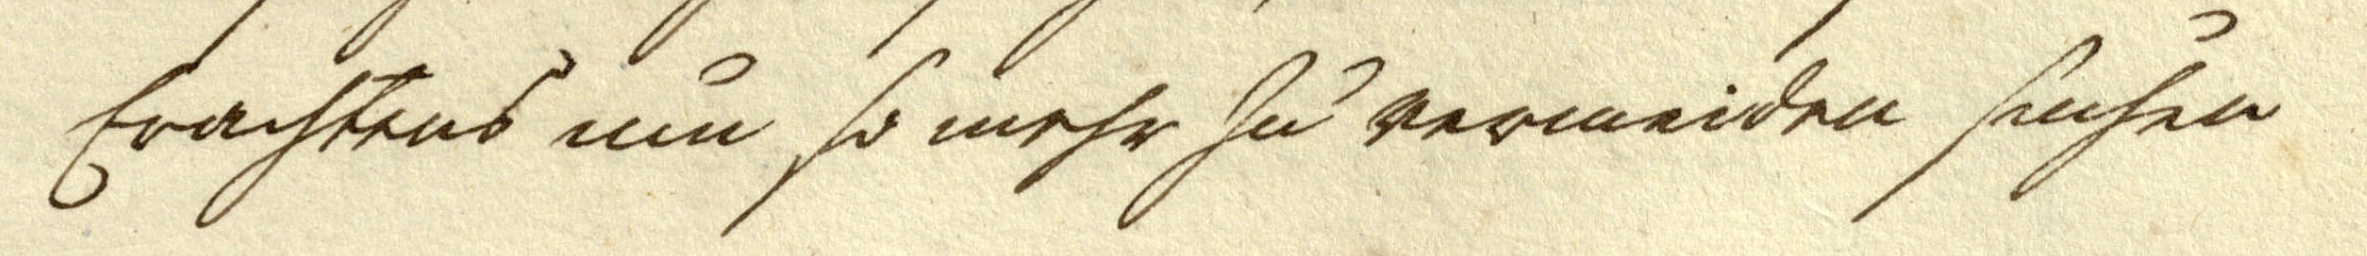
Erachtens um so mehr zu vermeiden suchen
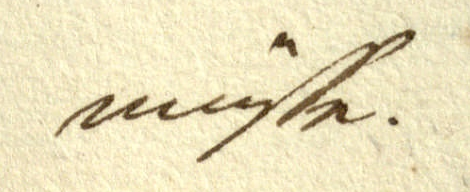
müsse.
